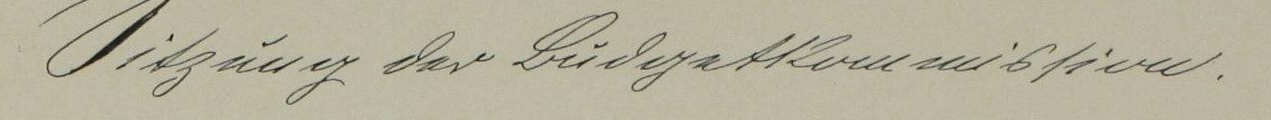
Sitzung der Budgetkommission.
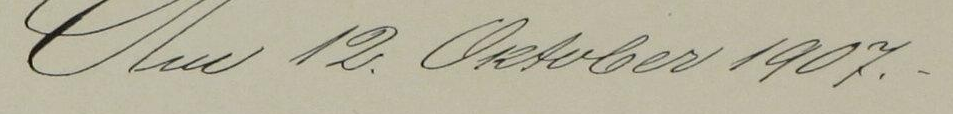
Am 12. Oktober 1907.
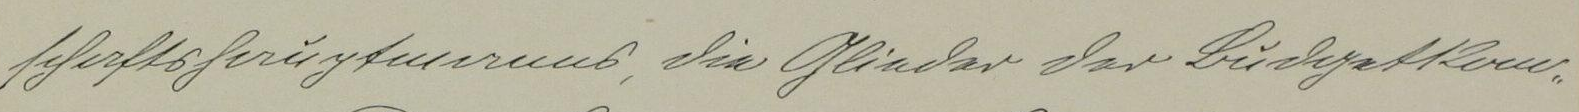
schaftshauptmanns, die Glieder der Budgetkom-
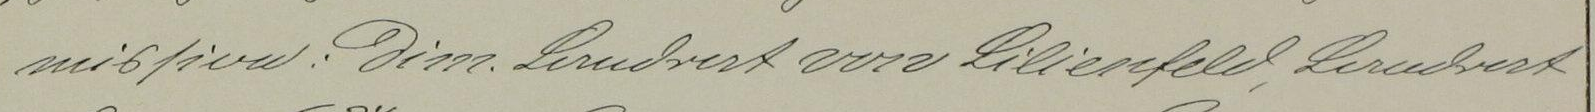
mission: dim. Landrat von Lilienfeld, Landrat
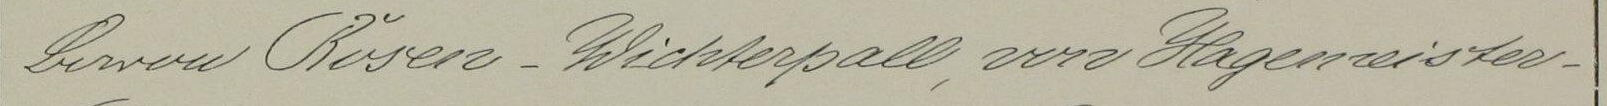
Baron Rosen-Wichterpall, von Hagemeister-
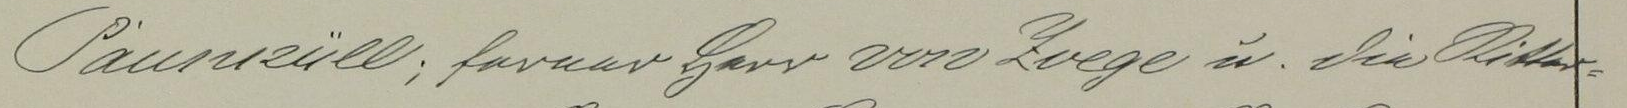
Paunküll; ferner Herr von Zoege u. die Ritter-
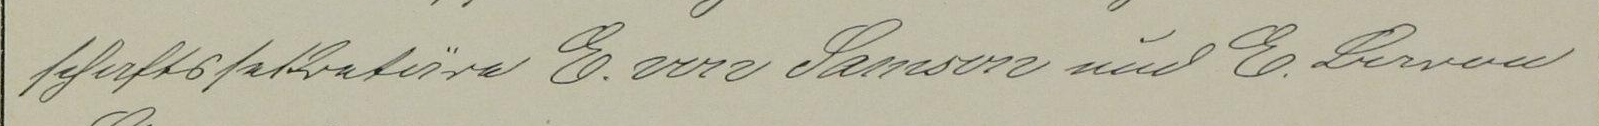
schaftssekretäre E. von Samson und E. Baron
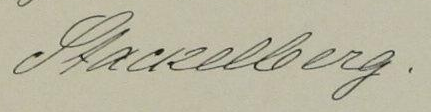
Stackelberg.
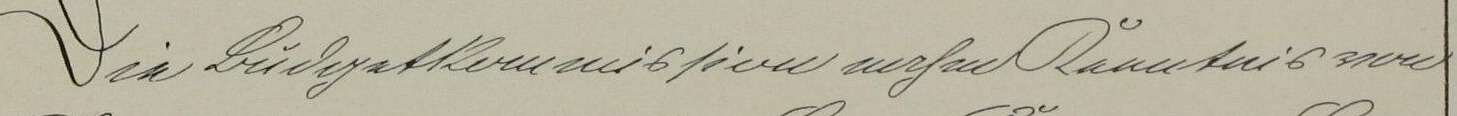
Die Budgetkommission nahm Kenntnis von
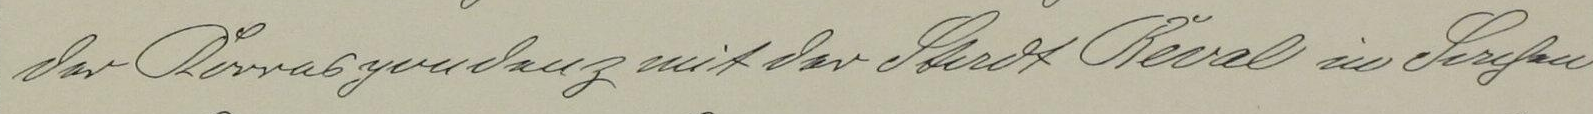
der Korrespondenz mit der Stadt Reval in Sachen
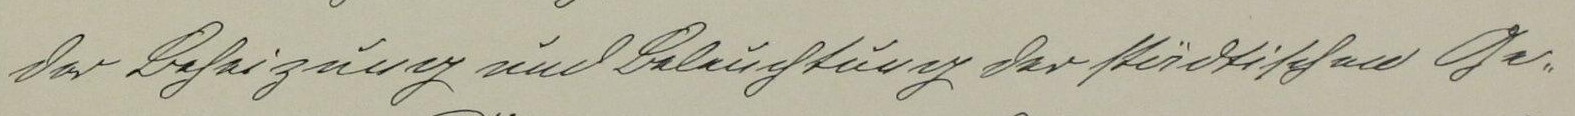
der Beheizung und Beleuchtung der städtischen Ge-
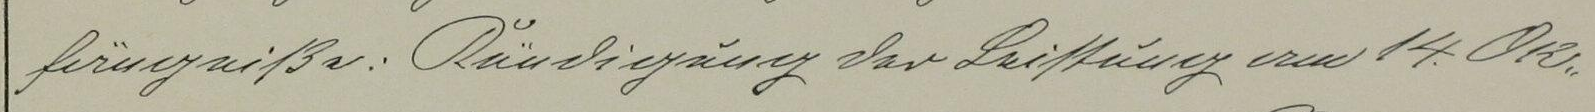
fängniße: Kündigung der Leistung am 14. Ok-
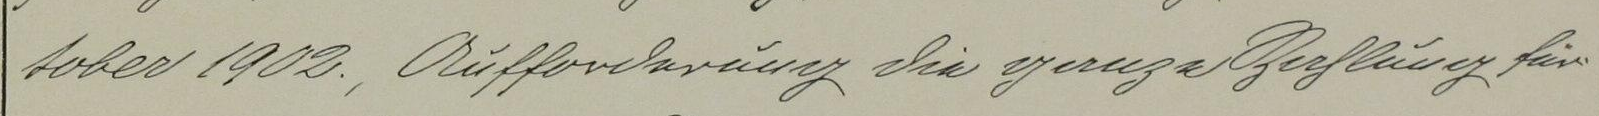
tober 1902., Aufforderung, die ganze Zahlung für
